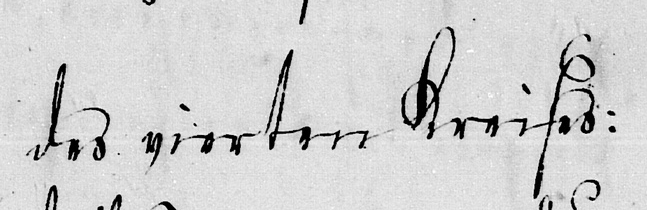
des vierten Kreises:
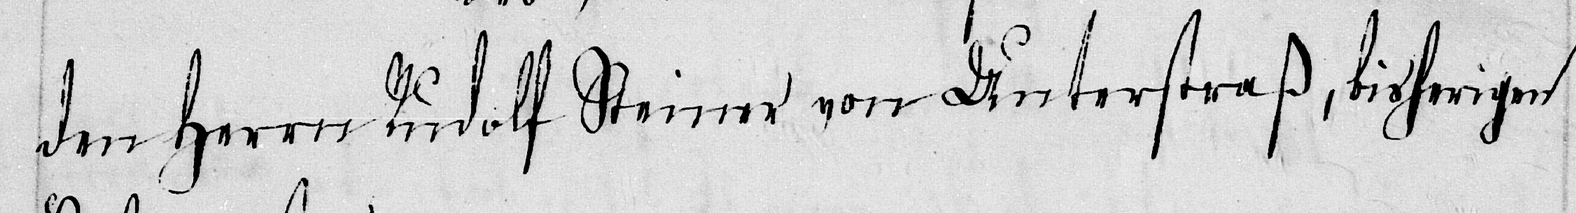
den Herrn Rudolf Steiner von Unterstraß, bisherigen
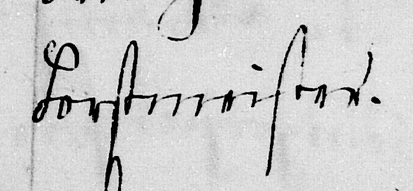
Forstmeister.
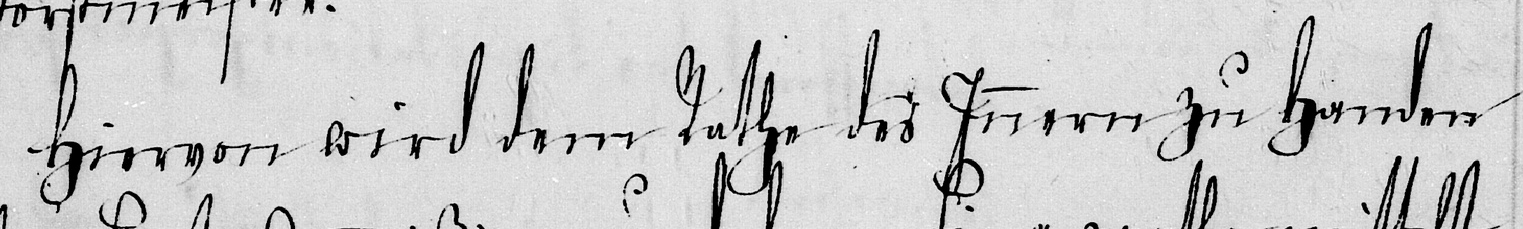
Hiervon wird dem Rathe des Innern zu Handen
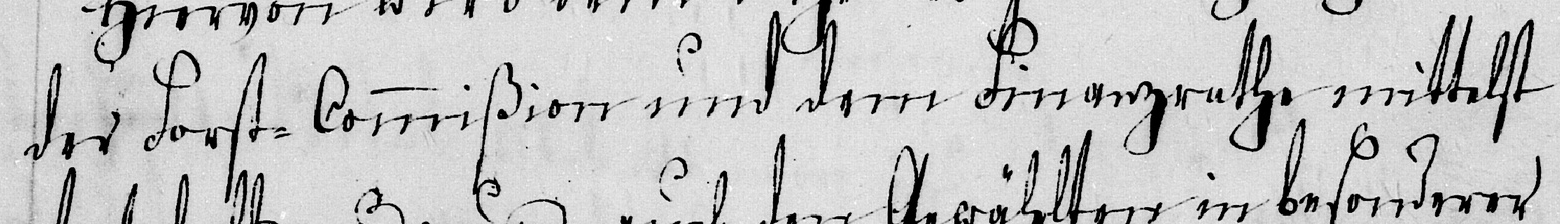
der Forst-Commißion und dem Finanzrathe mittelst
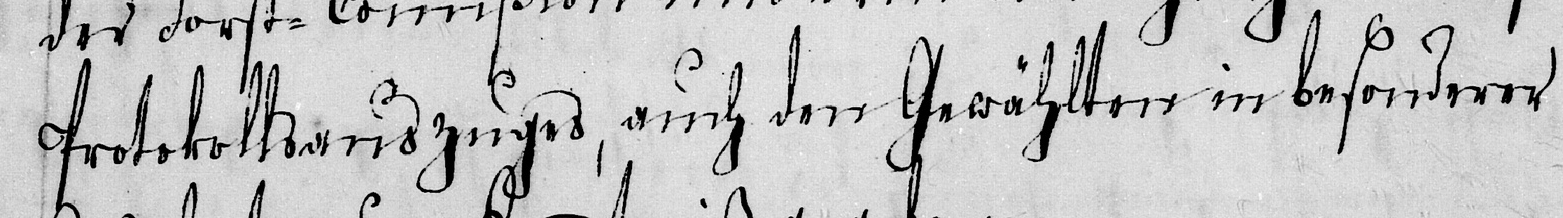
Protokollsauszuges, auch den Gewählten in besonderer
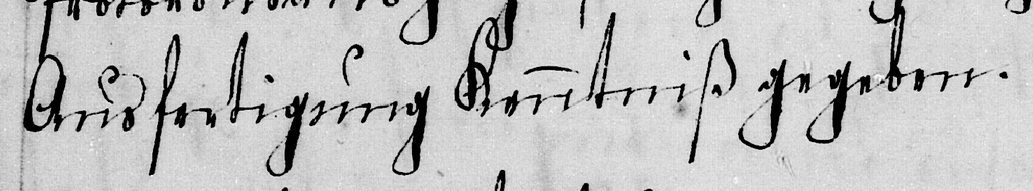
Ausfertigung Kenntniß gegeben.
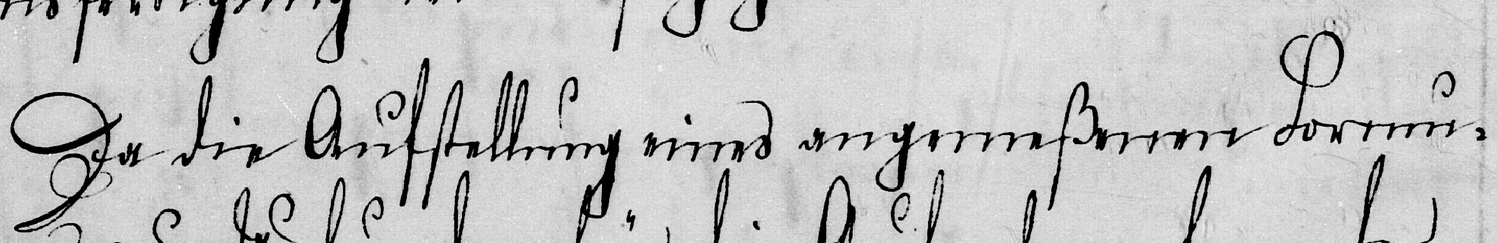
Da die Aufstellung eines angemeßenen Formul¬
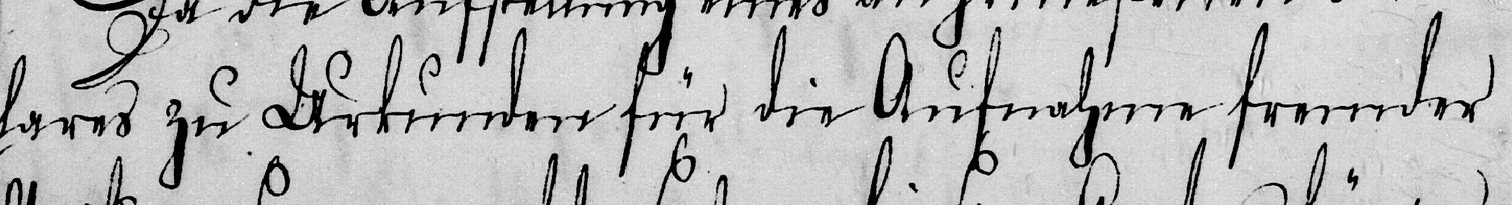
ares zu Urkunden für die Aufnahme fremder
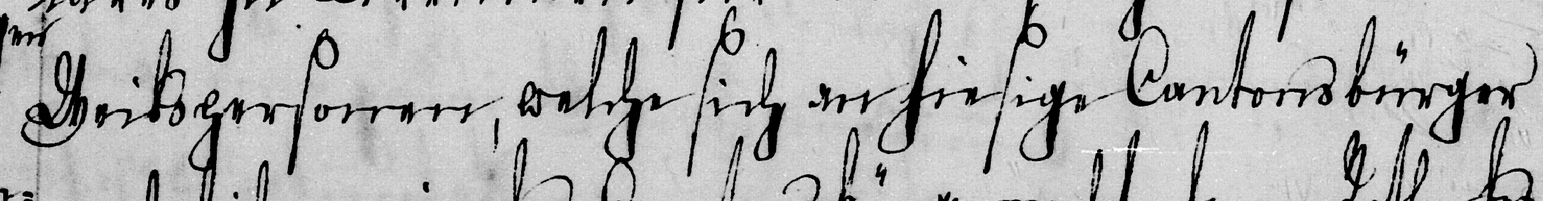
Weibspersonen, welche sich an hiesige Cantonsbürger
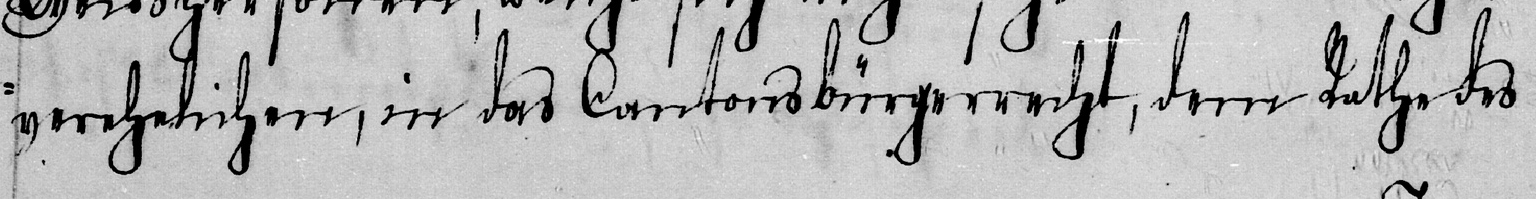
verehelichen, in das Cantonsbürgerrecht, dem Rathe des
